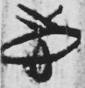志
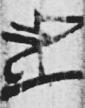者
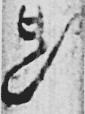也
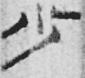少（小）
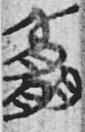○（宛）
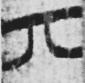亓（其）
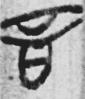言
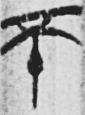不
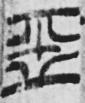亞（惡）
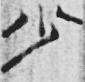少
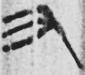又（有）
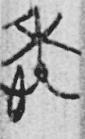○（佞）
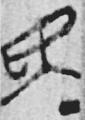𡚦（焉）
